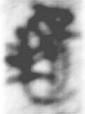○（鞍）
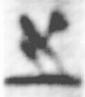之
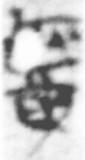○（緅）
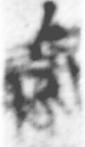顯（韅）
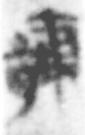鞅
